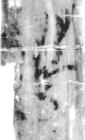○（夏）
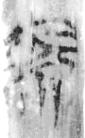○（夕）
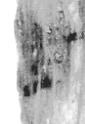才（在）
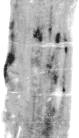北
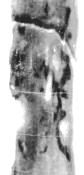獻
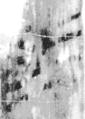馬
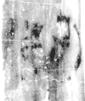○（荆）
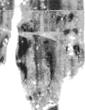𫵖
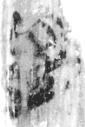○（夏）
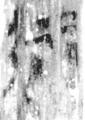𫵖
